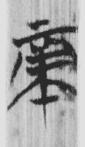帝
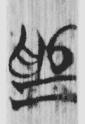爲
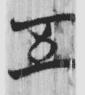五
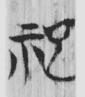祀
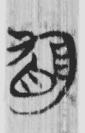{勹目}
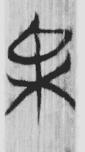冥
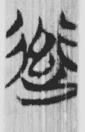{行糸止}
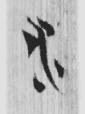水
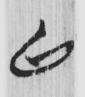㠯（以）
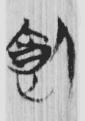飤
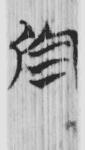於
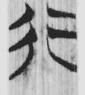行
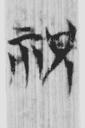祝
